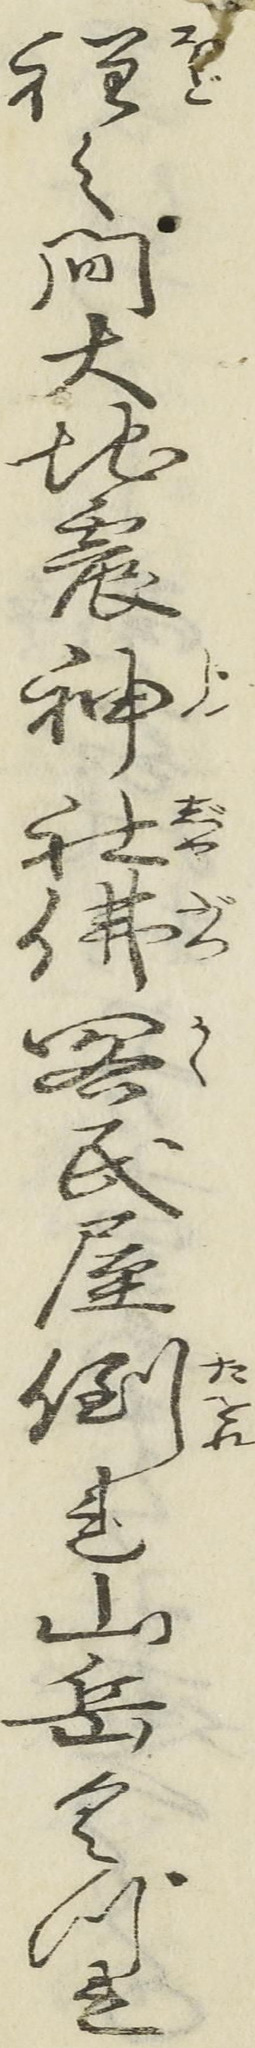程の間大地震神社仏閣民屋倒山岳くつれ
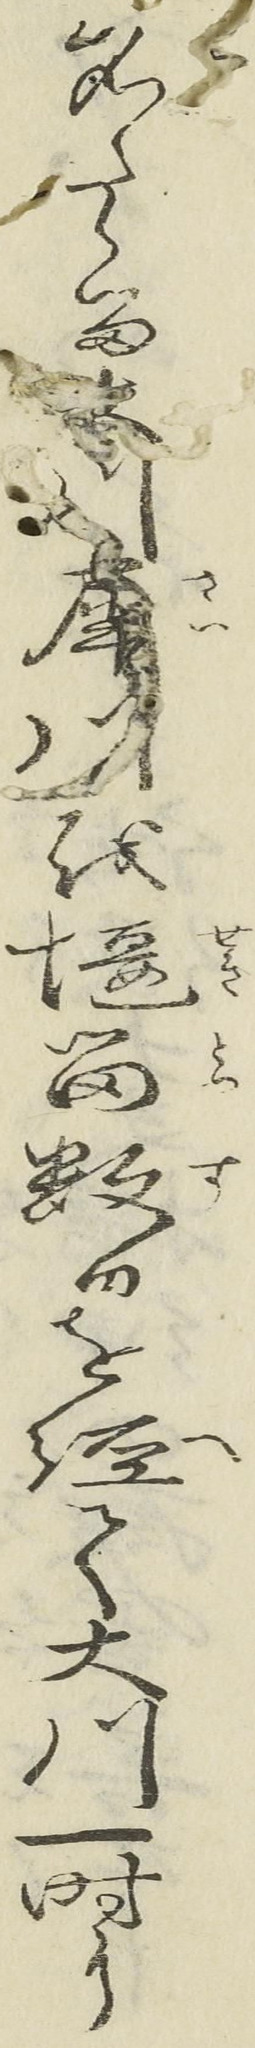名たゝる大？川？犀川を堰留数日を経て大川一時に
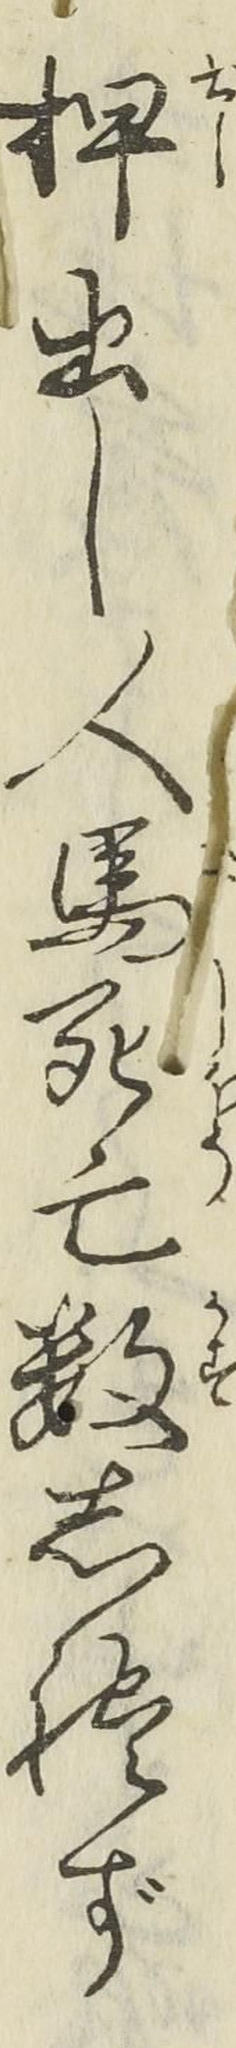押出し人馬死亡数しれず
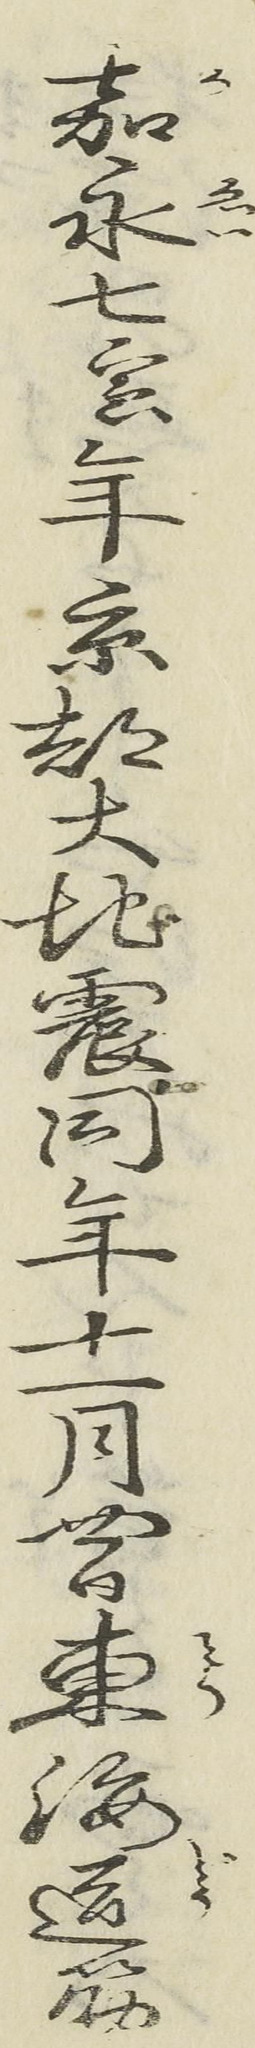〇嘉永七年寅年京都大地震同年十一月四日東海道筋
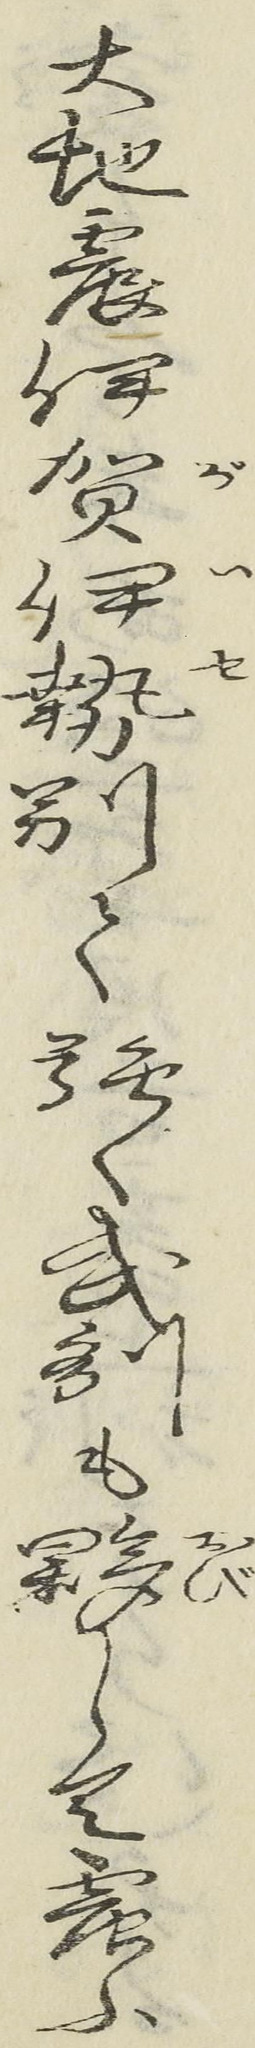大地震伊賀伊勢別て強く武州も夥しく震ふ
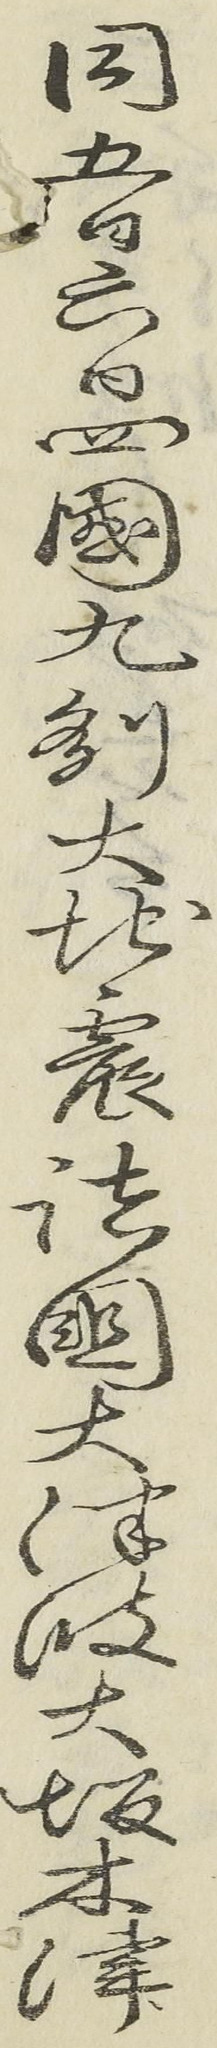同五日六日四国九州大地震諸国大津波大坂木津
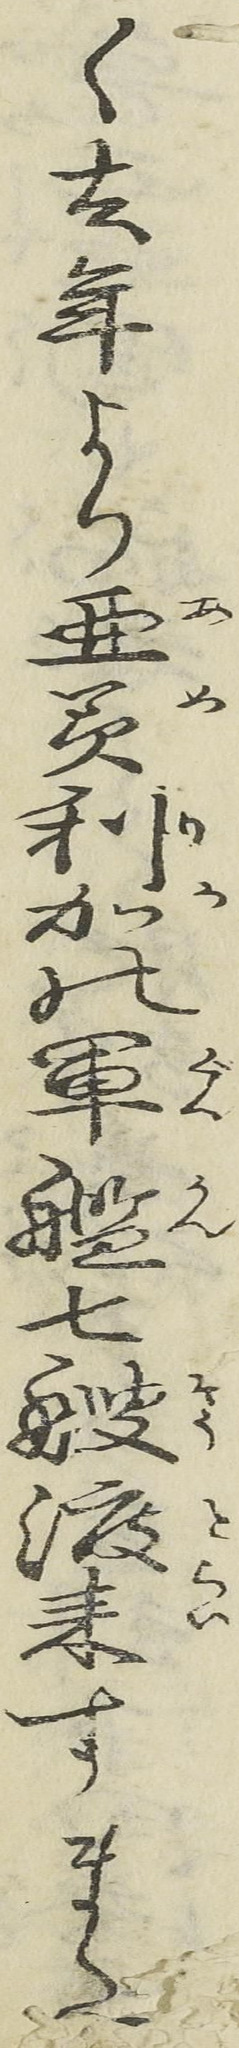く去年より亜免利加の軍艦七艘渡来すまた

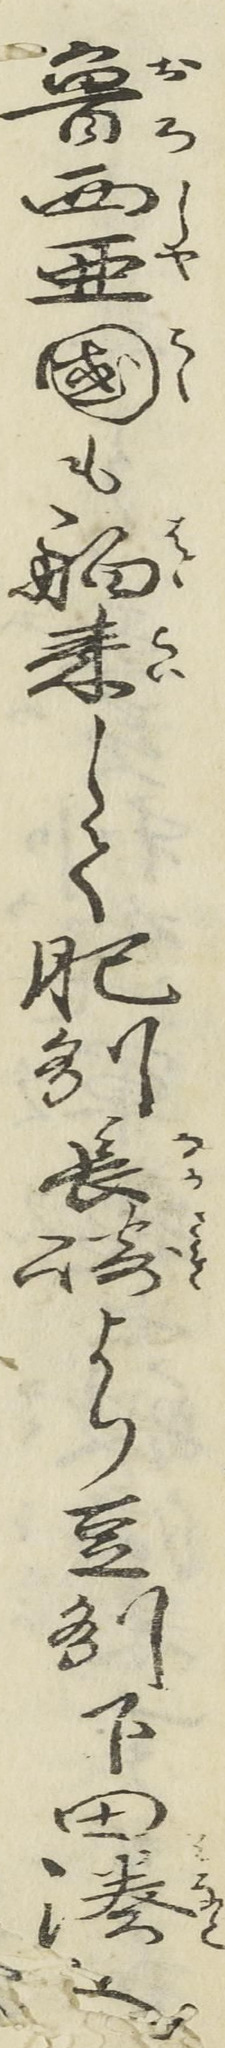魯西亜國も舶来して肥州長崎より豆州下田湊へ
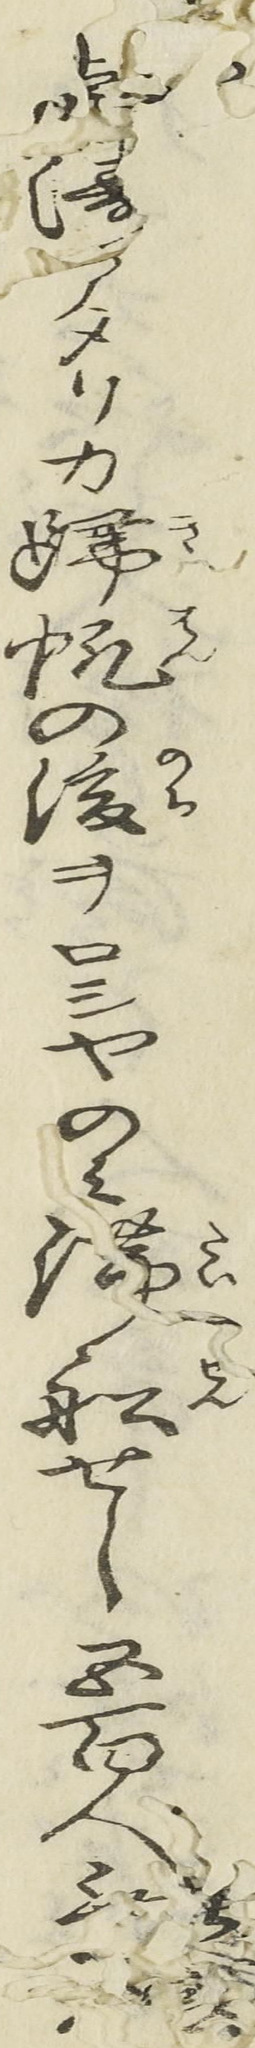アメリカ帰帆の後ヲロシヤのみ滞船せし五百人無残？
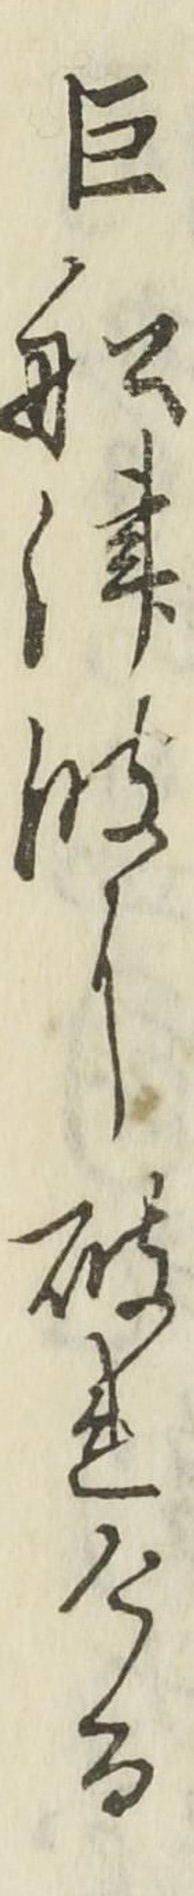巨舩津波に破れたる
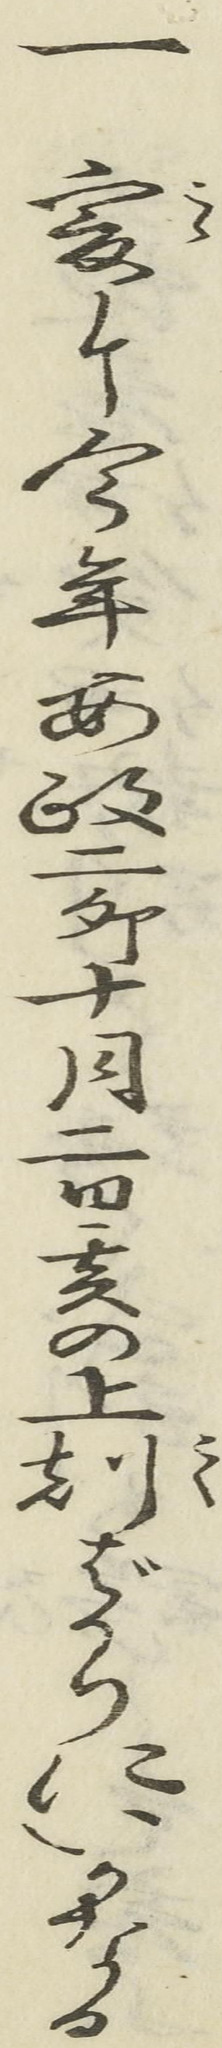一爰に今年安政二卯十月二日亥の上刻ばかりにいかなる
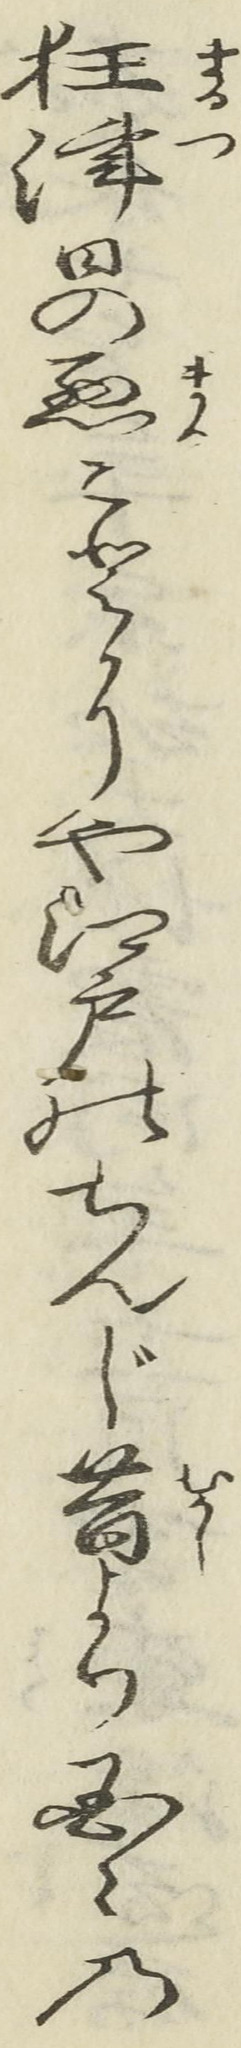狂津日の悪ことにや江戸のちんじ昔より国々の
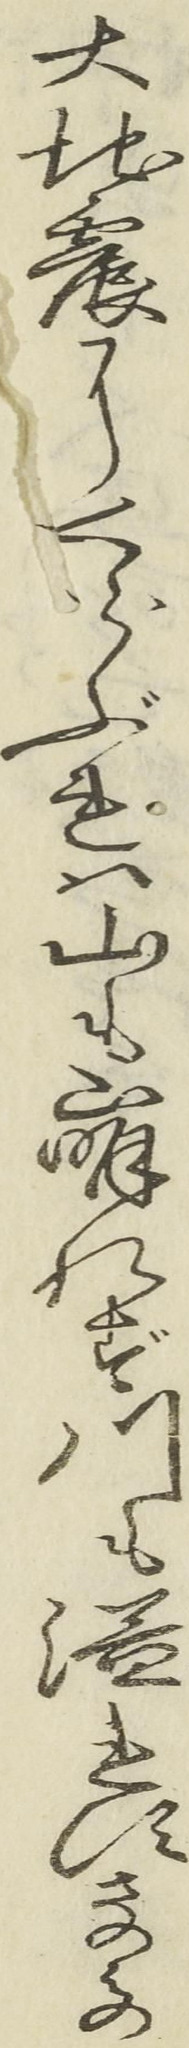大地震にくらぶれは山も崩れず川も溢れすさのみの
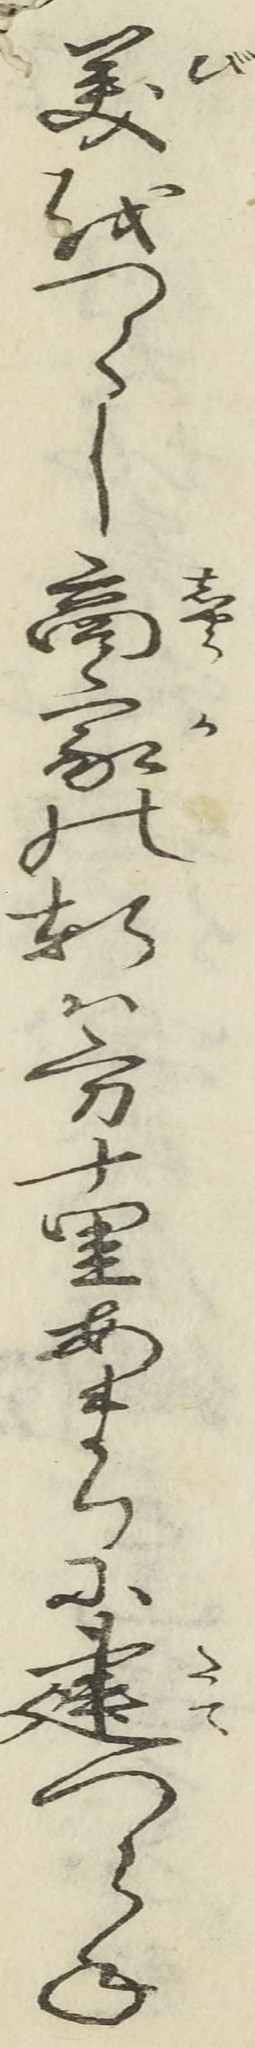美をつくし商家の軒は方十里あまりに建つらね
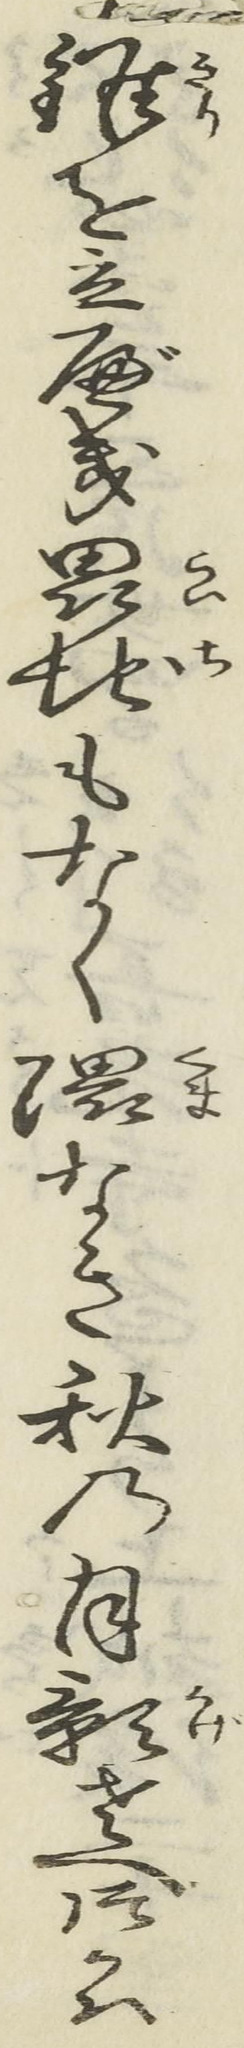錐を立べき畾地もなく隈なき秋の月影さへつ
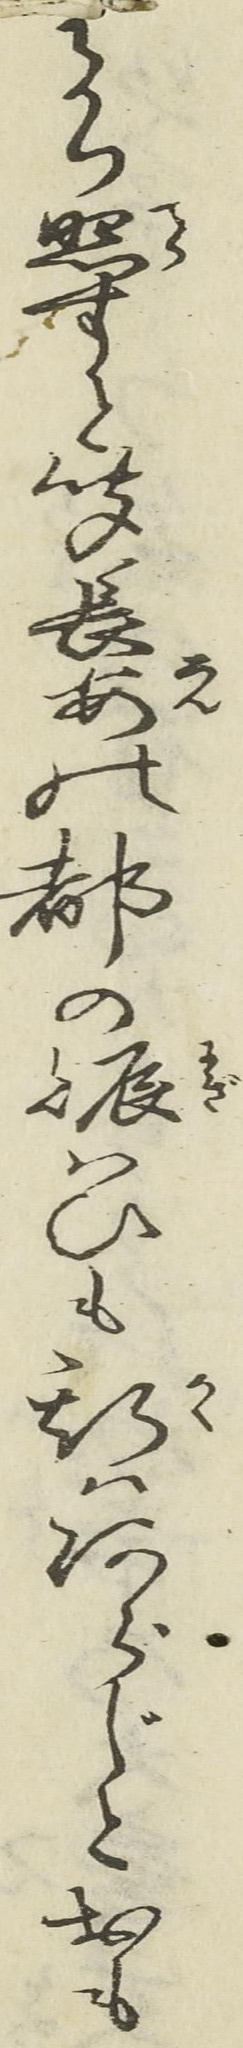はかり照すと聞長安の都の賑はひも斯はあらじとおも
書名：震雷考説　全
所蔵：東京大学地震研究所図書室 Earthquake Research Institute Library, The University of Tokyo, JAPAN
